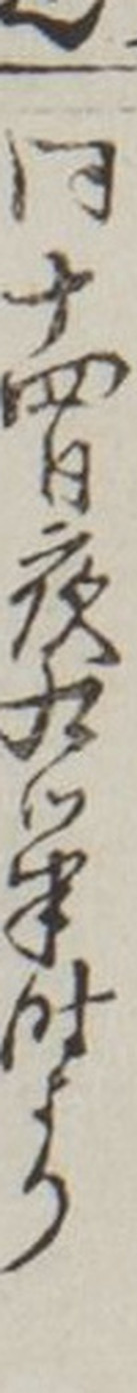同十四日夜九ッ半時より
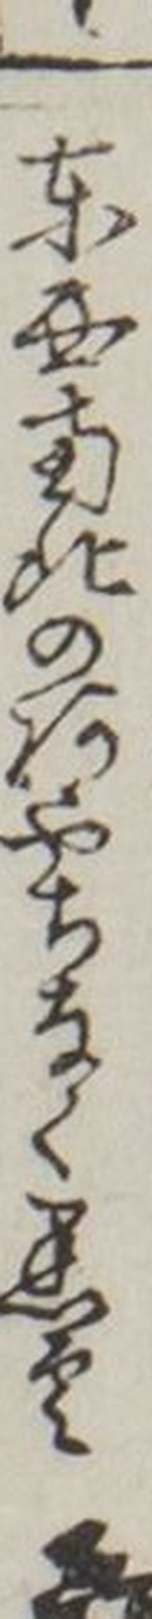東西南北のあやちなく黒雲
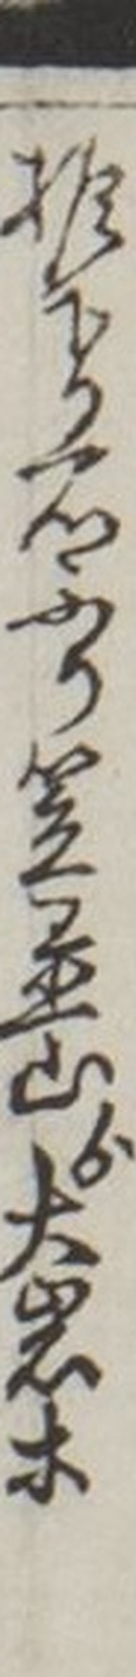振下り石ふり笠置山より大岩等
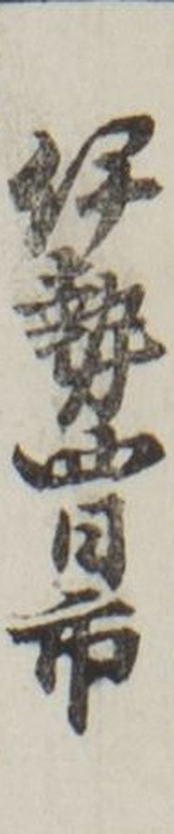伊勢四日市
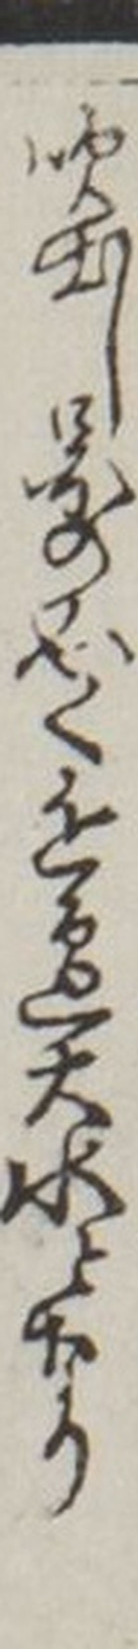吹出し図の如く近辺大水となり
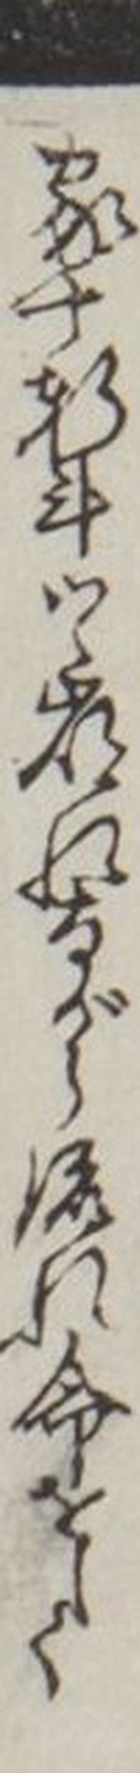家十軒計りツヽ崩れながら流れ命をしく
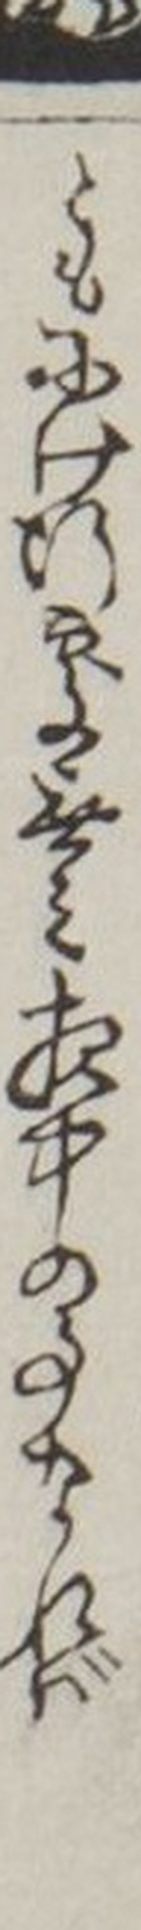ともにけ行処無之夜中の事なれば
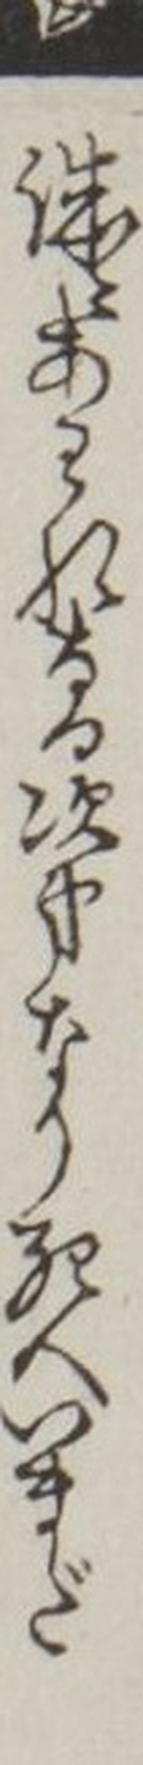誠にあわれなる次第なり死人いまだ
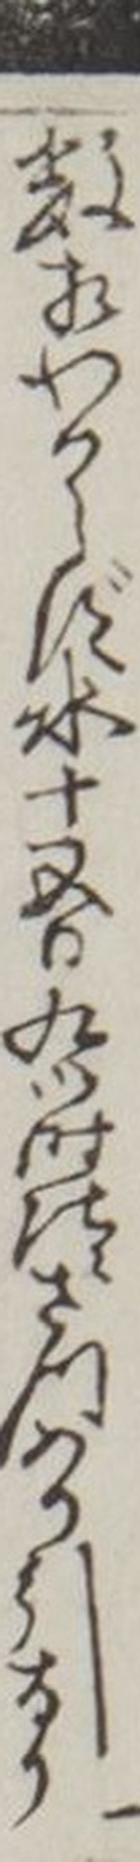数相わからず水十五日九ッ時比にさつはり引くなり
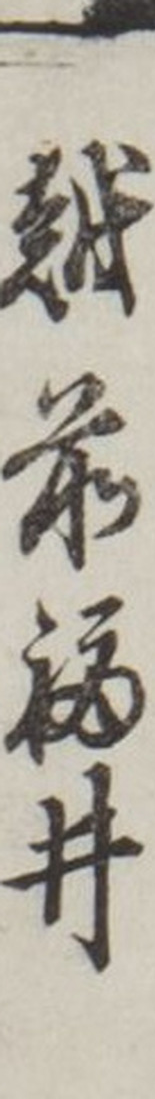越前福井
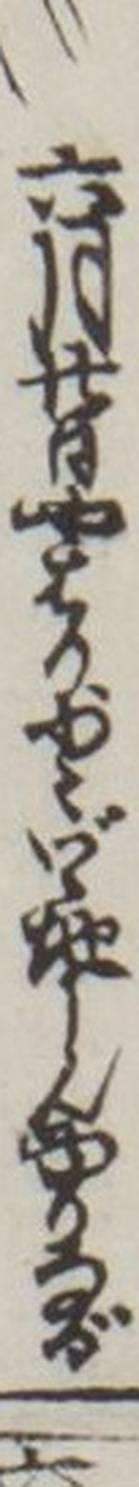六月廿日やはり少々ヅヽ地しんゆりなが
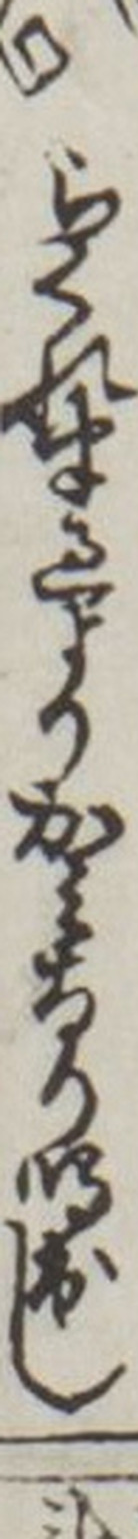らくれ半過よりかみなり鳴出し
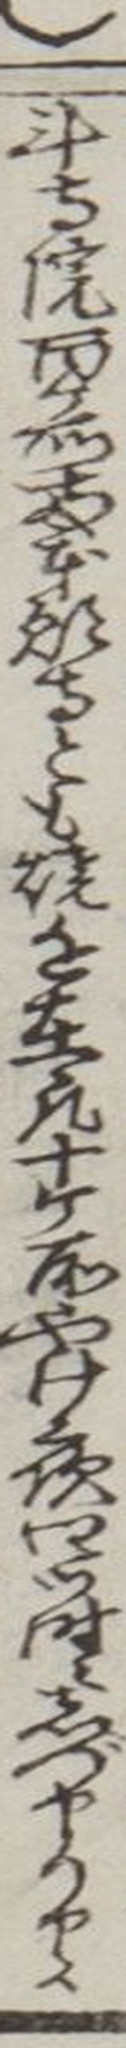計寺院百ヶ所両本願寺とも焼近在凡十ヶ所やけ夜四ッ時にしづまり申候
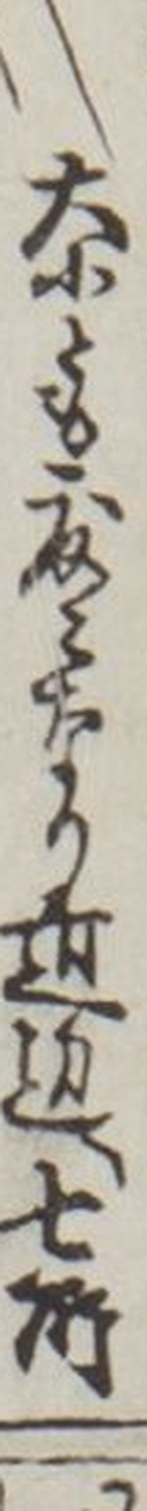大小とも度々なり近近へ七所
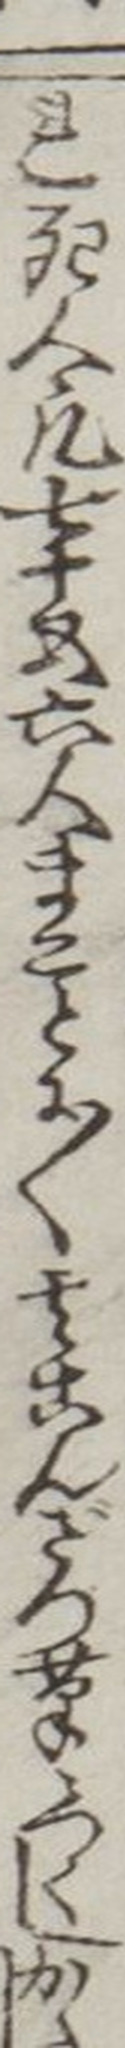れ死人凡七十五六人まことに〳〵其こんざつ筆につくしかたし
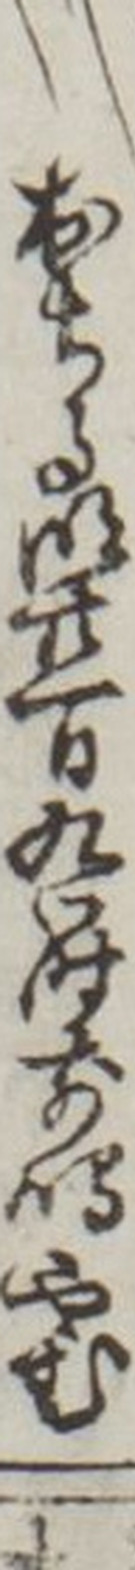おちる明廿一日九ッ時前鳴やむ
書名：早飛脚廻りにてくわしき所本しらべ大地震
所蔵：あいおいニッセイ同和損保株式会社
